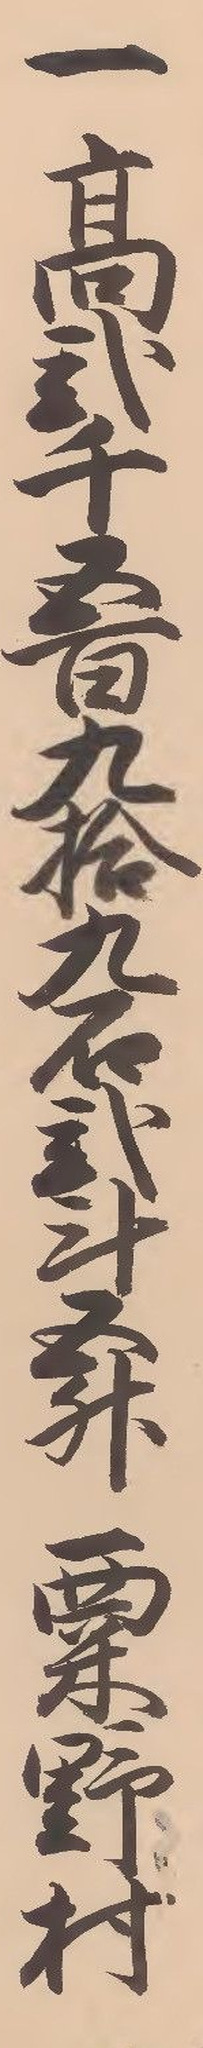一高弐千五百九拾九石弐斗五升粟野村
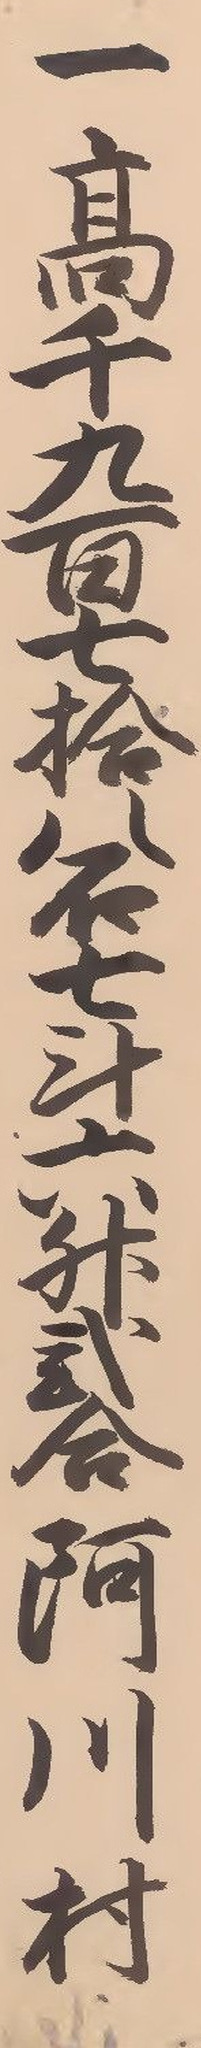一高千九百七拾八石七斗六升弐合阿川村

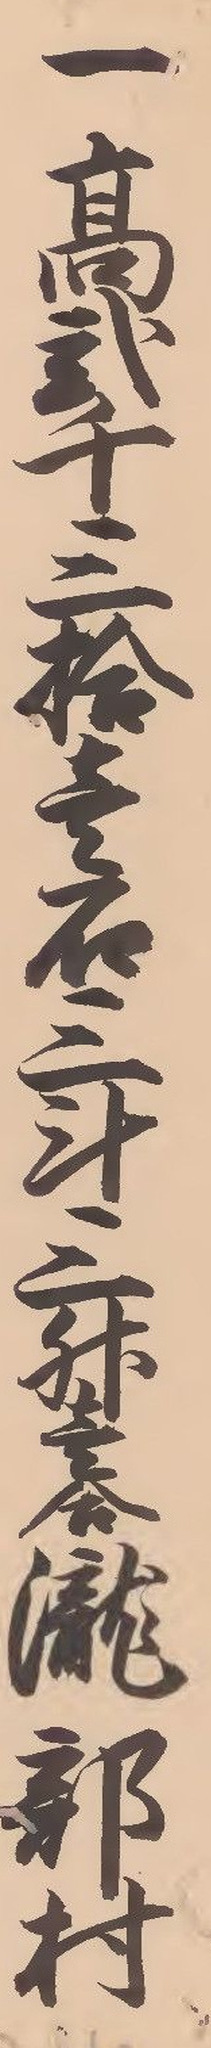一高弐千三拾壱石三斗三升壱合瀧部村
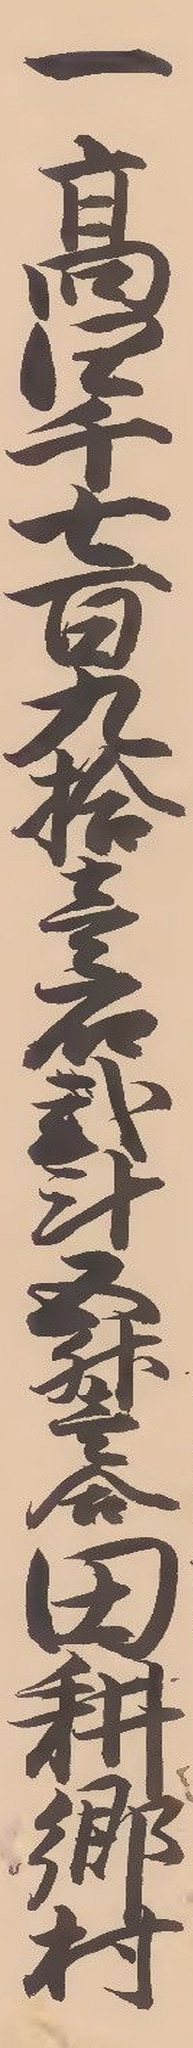一高四千七百九拾壱石弐斗五升壱合田耕郷村
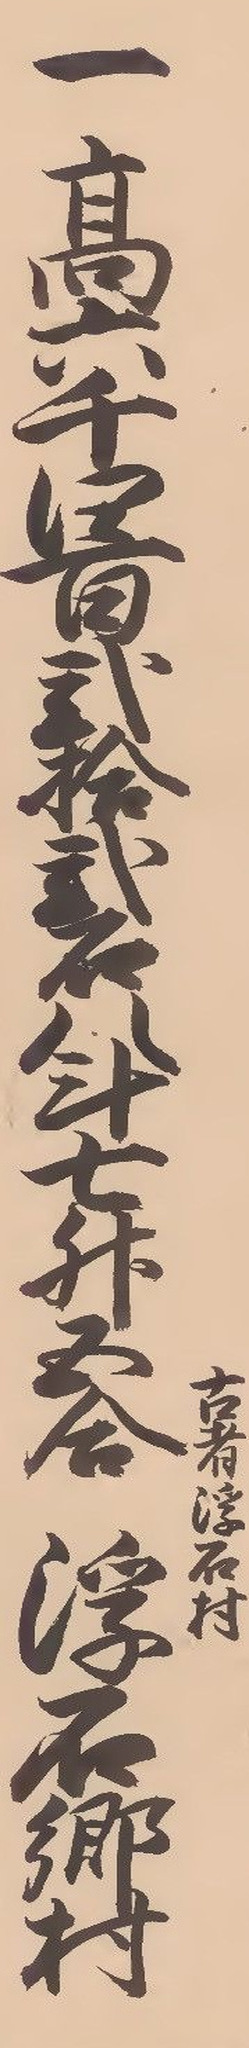一高六千四百弐拾弐石八斗七升五合浮石郷村
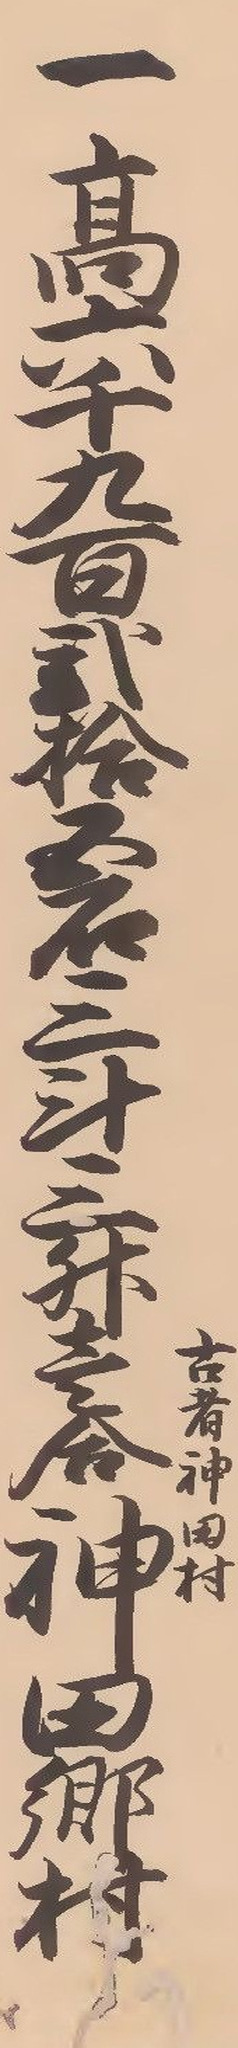一高六千九百弐拾五石三斗三升壱合神田郷村
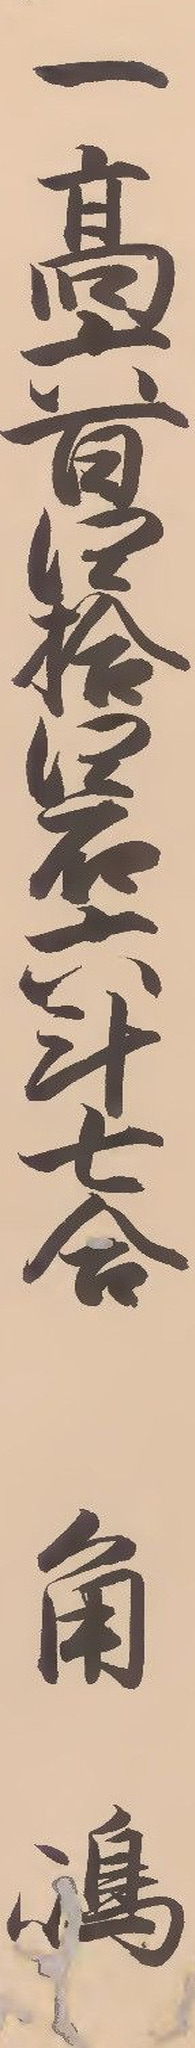一高六百四拾四石六斗七合角嶋
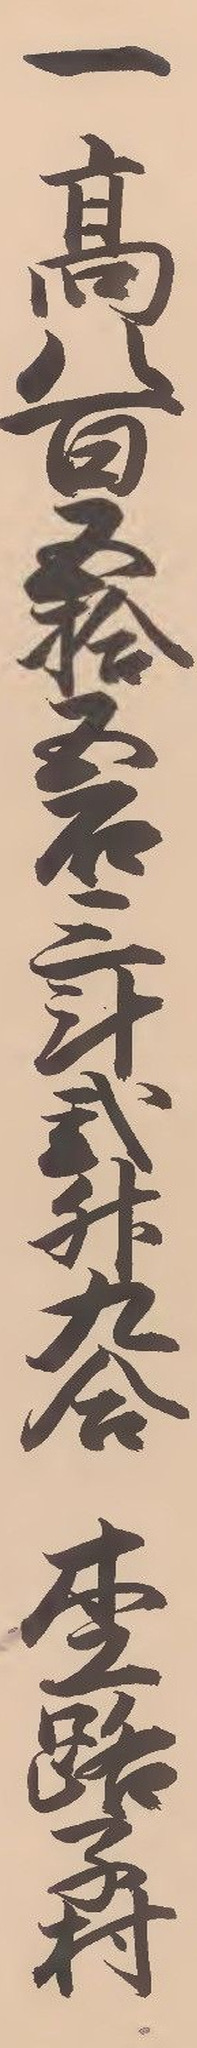一高八百五拾五石三斗弐升九合杢路子村
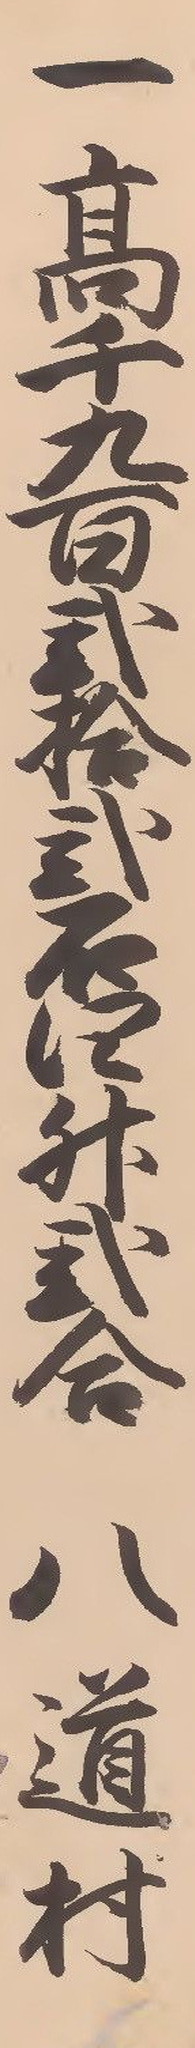一高千九百弐拾弐石四升弐合八道村
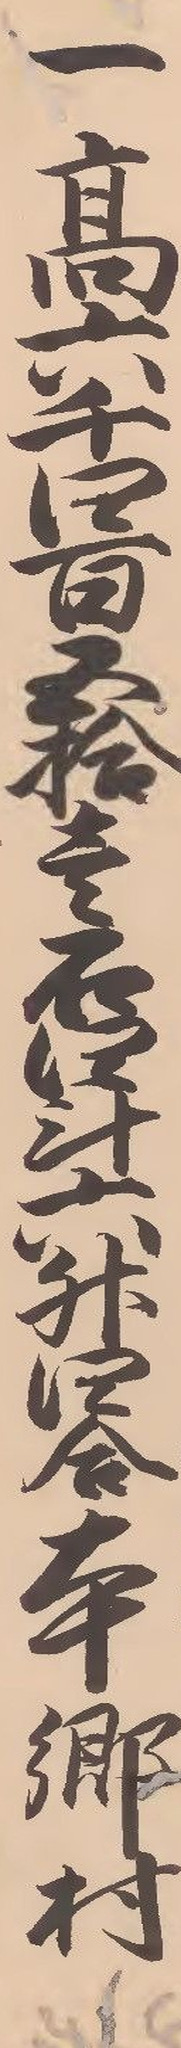一高六千四百五拾壱石四斗六升四合本郷村

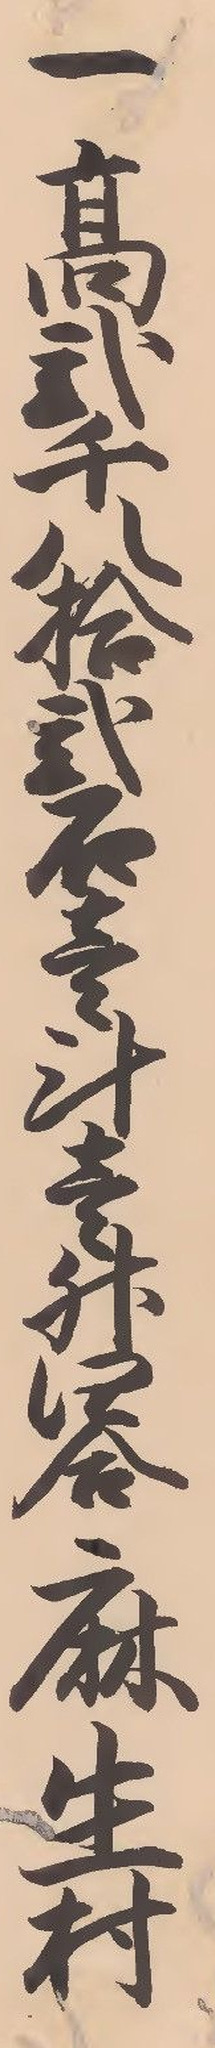一高弐千八拾弐石壱斗壱升四合麻生村
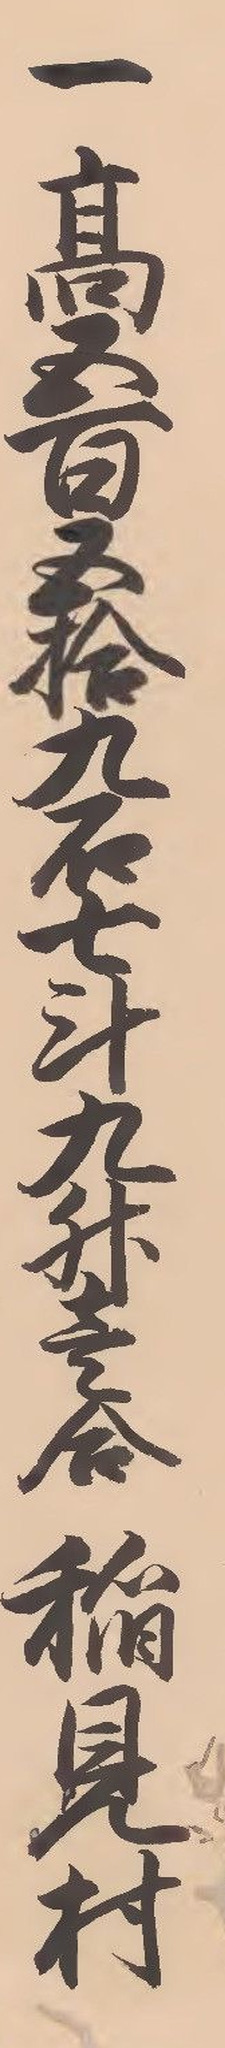一高五百五拾九石七斗九升壱合稲見村
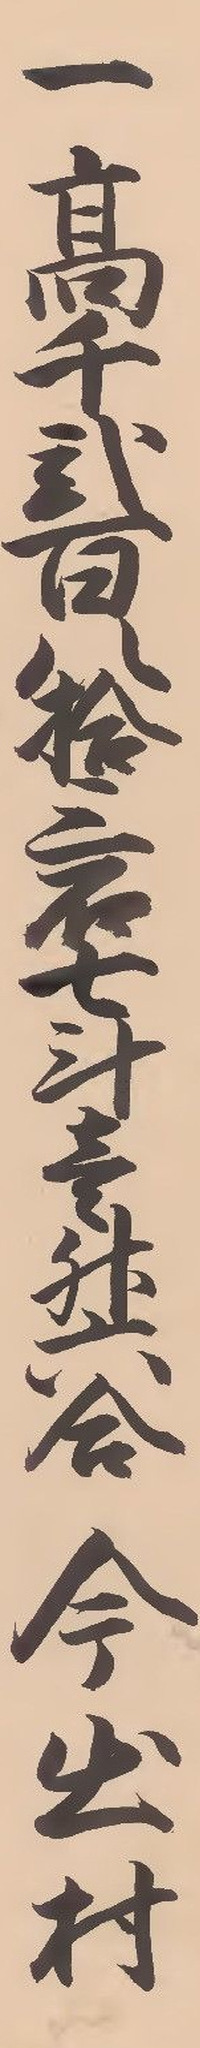一高千弐百八拾二石七斗壱升六合今出村
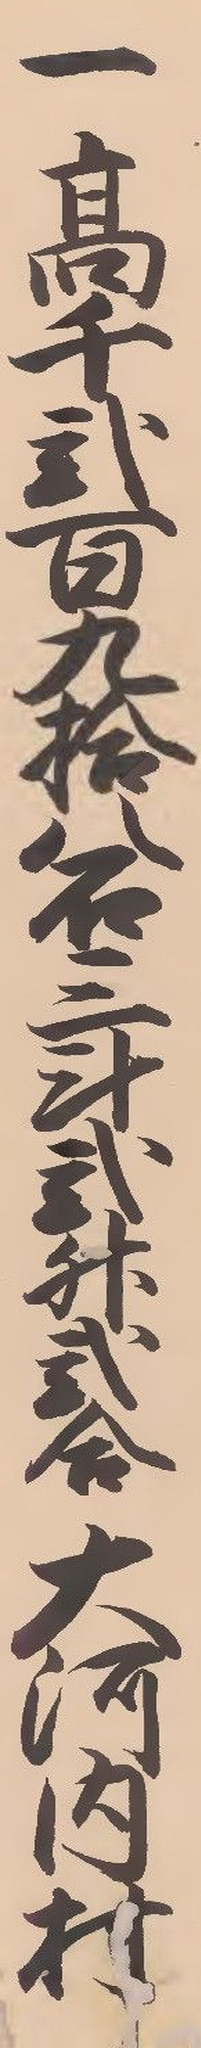一高千弐百九拾八石三斗弐升弐合大河内村
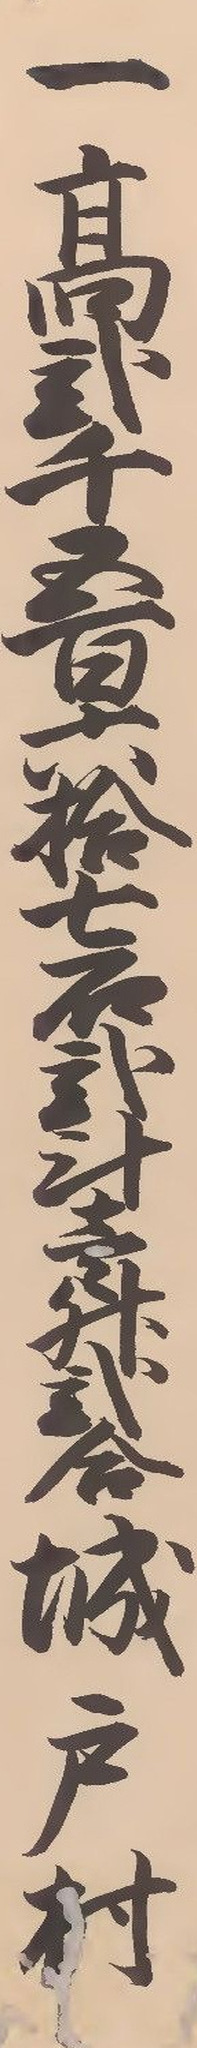一高弐千五百六拾七石弐斗壱升弐合城戸村
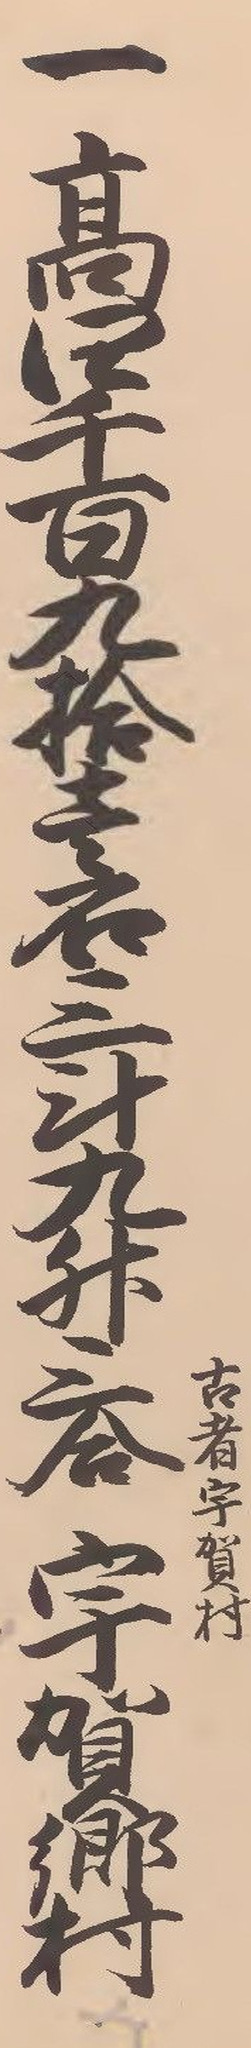一高四千百九拾壱石三斗九升三合宇賀郷村
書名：長門国郷帳
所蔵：国立公文書館 National Archives of Japan
